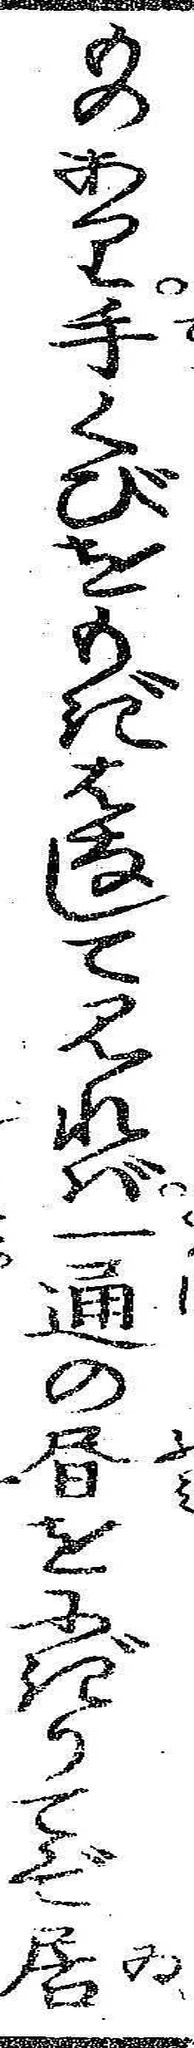ものあり。手くびをもぎはなして見れば。一通の書をにぎりてぞ居
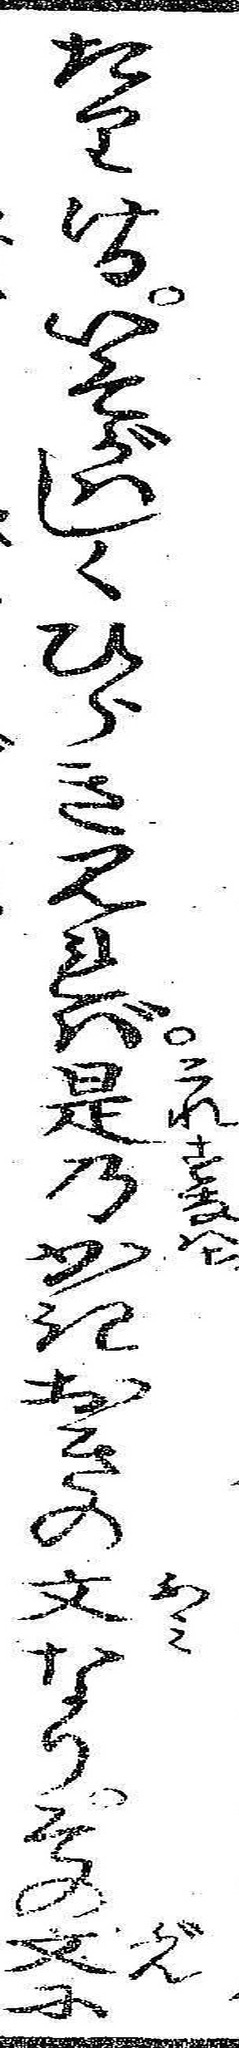たりける。いそがはしくひらき見れば。是乃かきおきの文なり。その文に
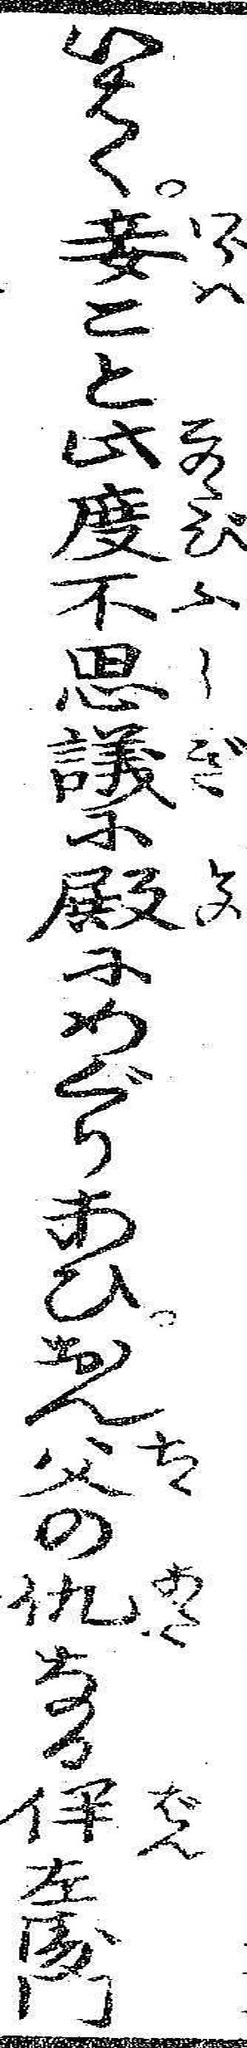いはく。妾こと此度不思議に殿にめぐりあひ。おん父の仇なる伴左衛門
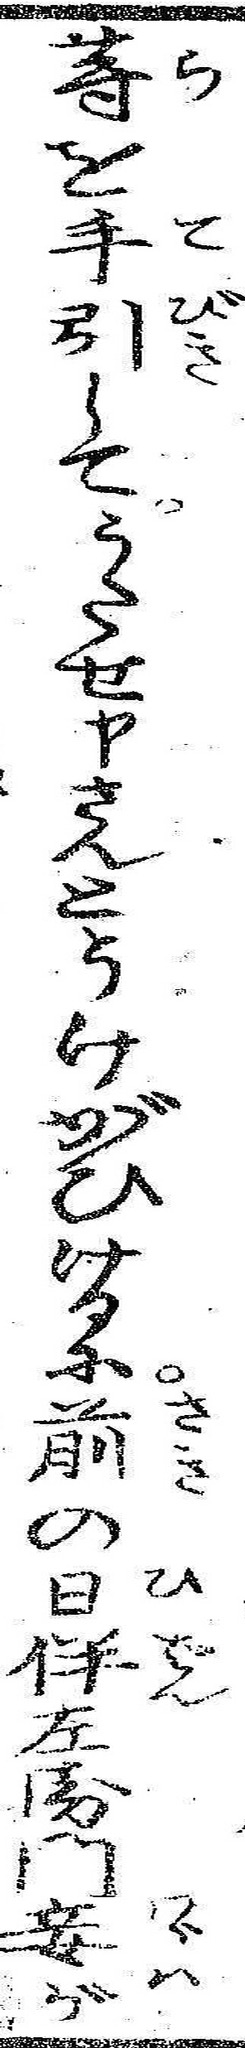等を手引して。うたせ申さんとうけがひけるに。前の日伴左衛門妾が
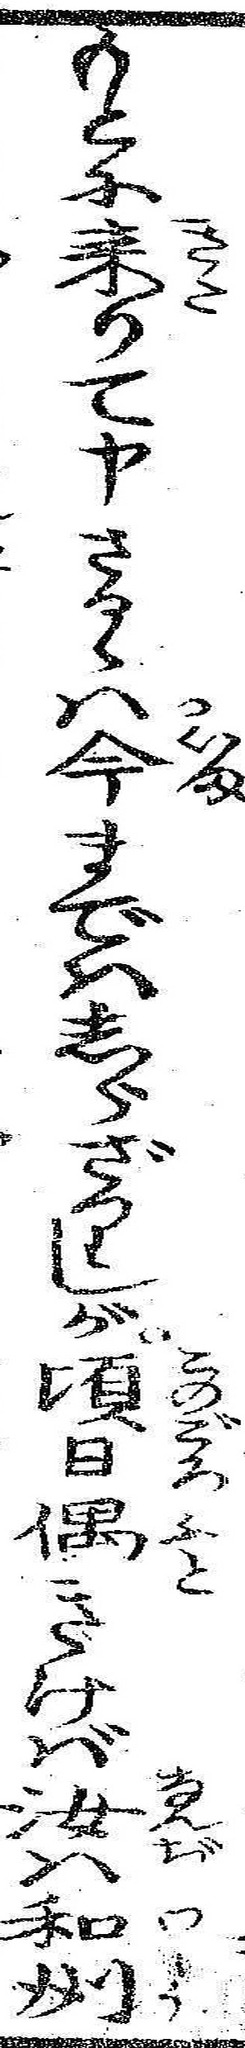もとに来りて申さるゝは。今まではしらざりしが。頃日偶きけば汝は和州
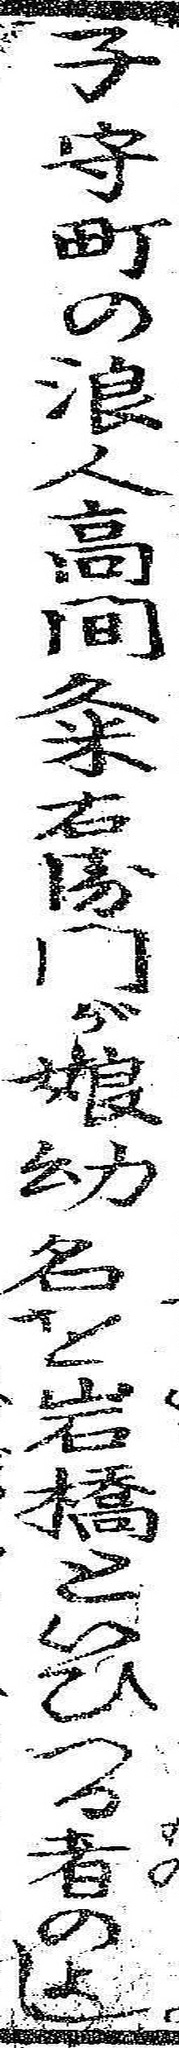子守町の浪人高間粂右衛門が娘幼名を岩橋といひつる者のよし。
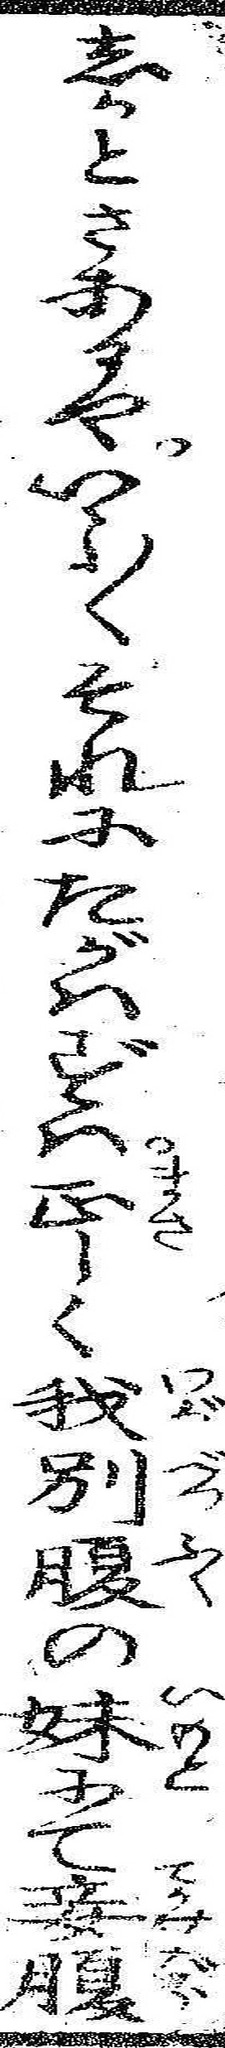しかとさあるや。いよ〳〵それにたがはずは。正しく我別腹の妹にて妾腹
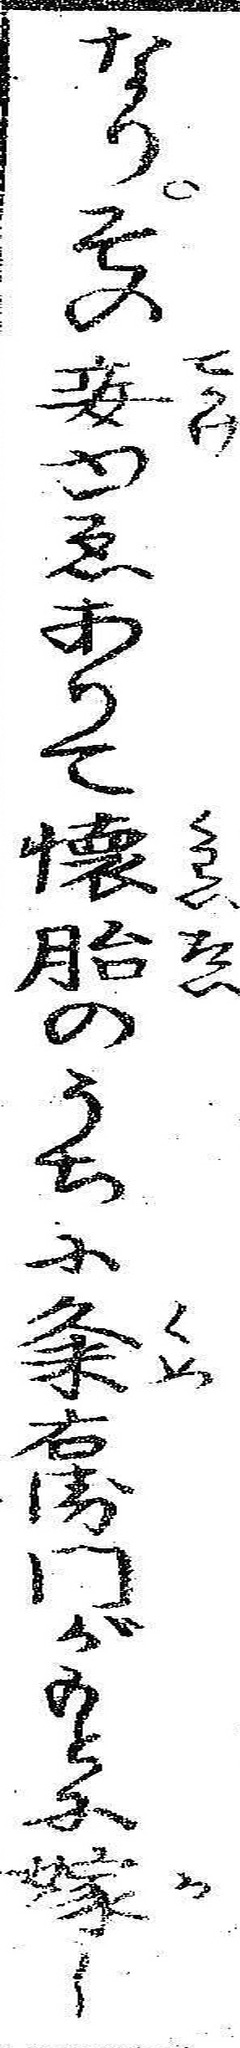なり。その妾ゆゑありて懐胎のうちに粂右衛門がもとに嫁し

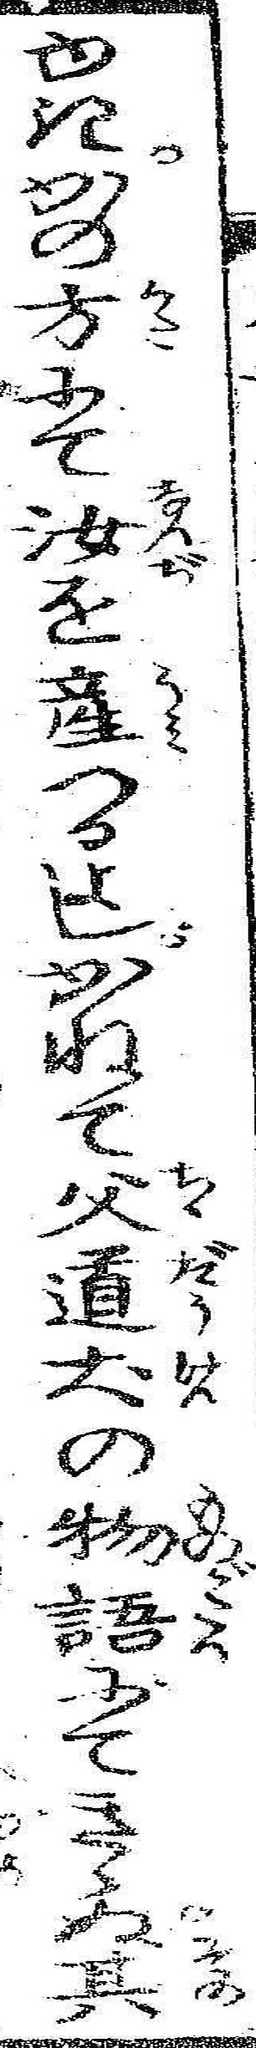ゆき。かの方にて汝を産つるよし。かねて父道犬の物語にてきゝぬ。其
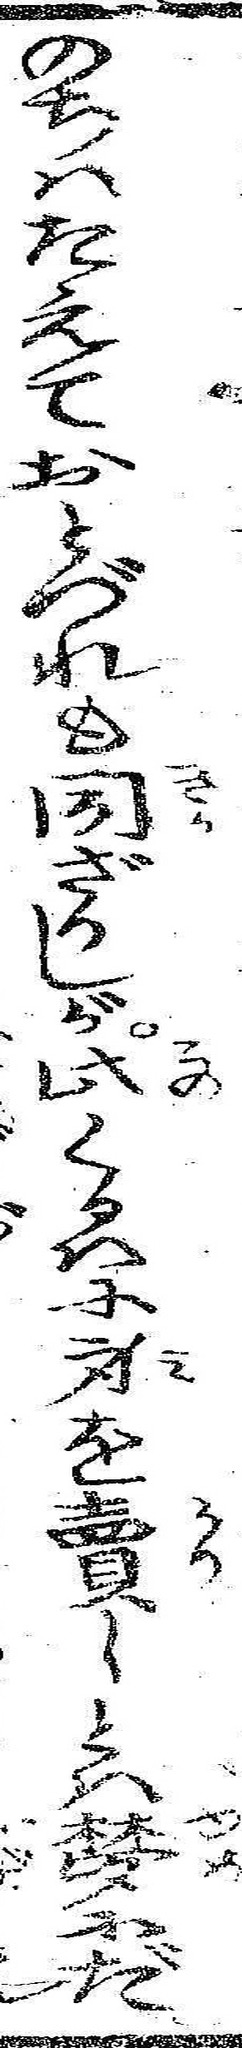のちはたえておとづれも聞ざりしが。此くるはに身を売しとは夢にだ
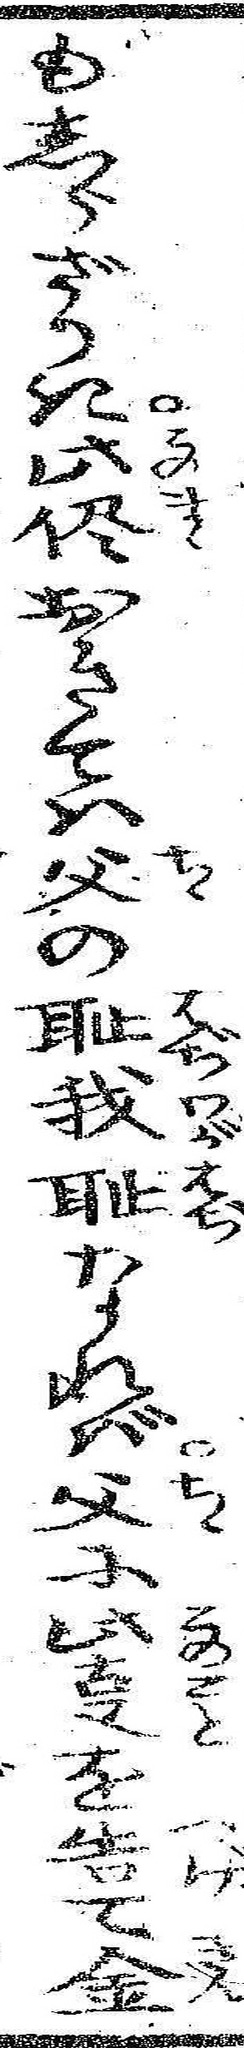もしらざりき。此侭おきては父の恥我恥なれば。父に此事を告て金
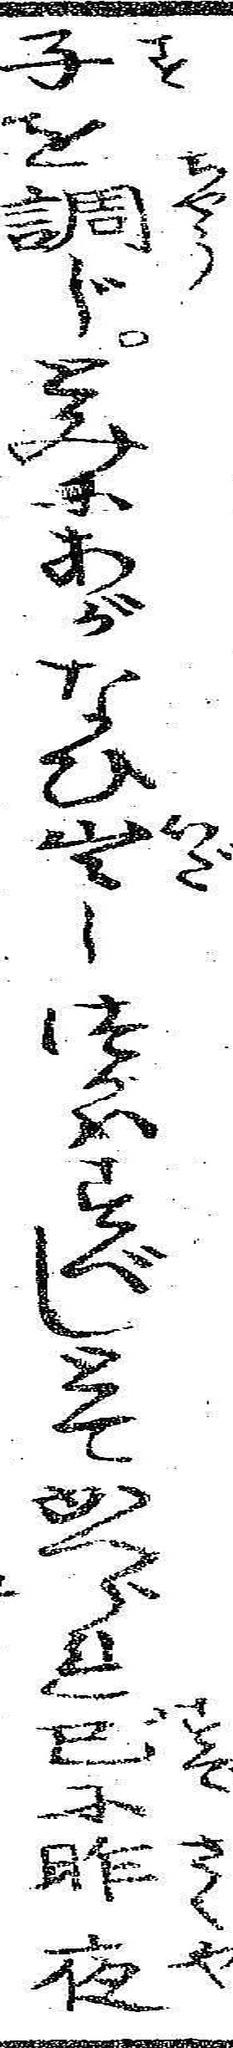子を調じ。とみにあがなひ出しつかはすべしとてかへられ。已に昨夜
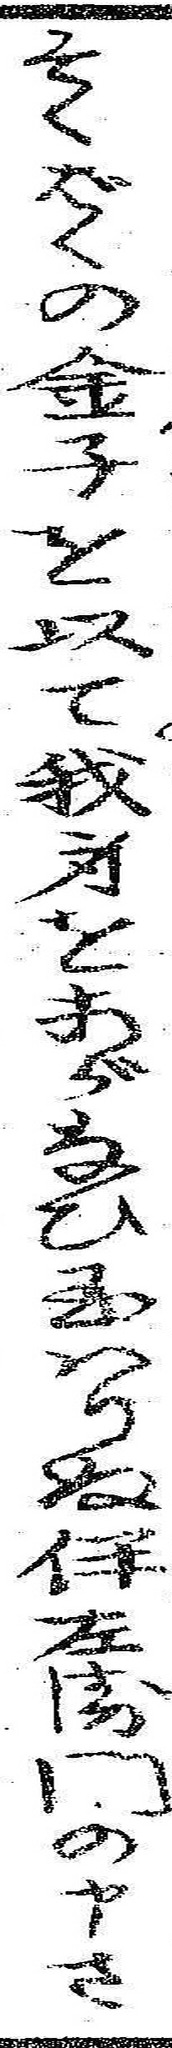そくばくの金子を以て。我身をあがなひ玉はりぬ。伴左衛門の申さ
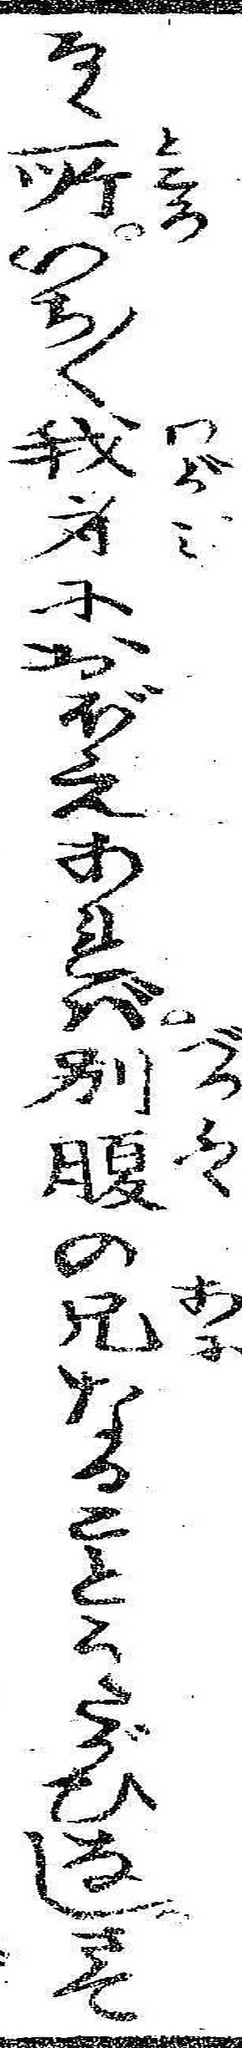るゝ所。いち〳〵我身におぼえあれば。別腹の兄なることうたがひなし。さて
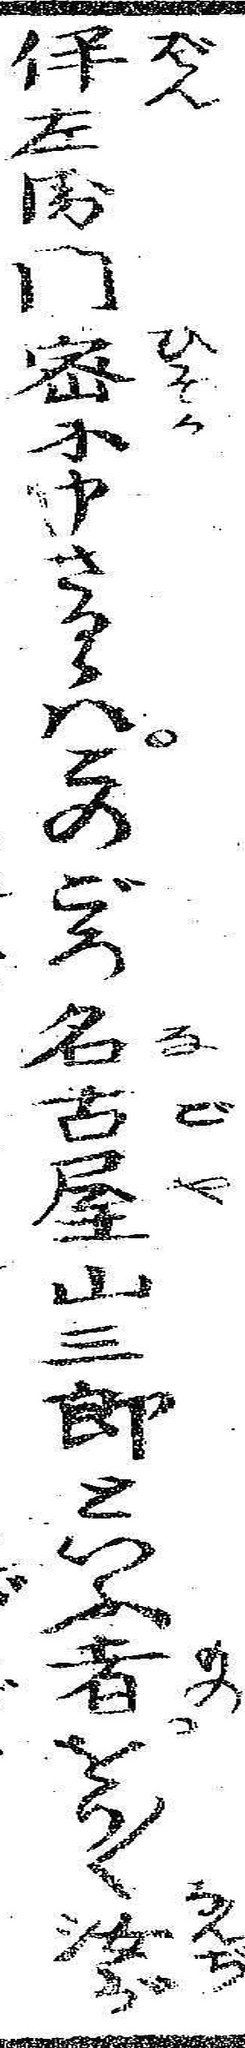伴左衛門密に申さるゝは。このごろ名古屋山三郎といふ者。をり〳〵汝が
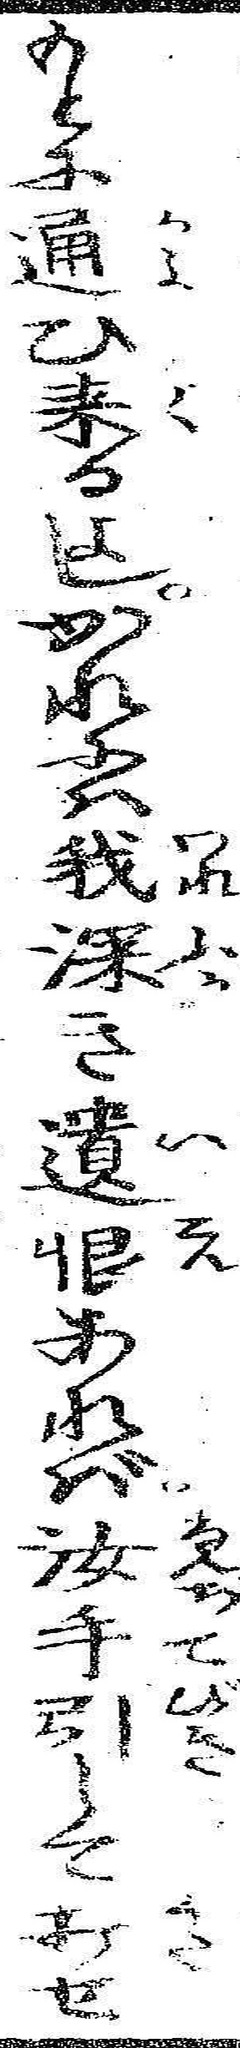もとに通ひ来るよし。かれには我深き遺恨あれば。汝手引して打せ
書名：昔話稲妻表紙
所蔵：国文学研究資料館
